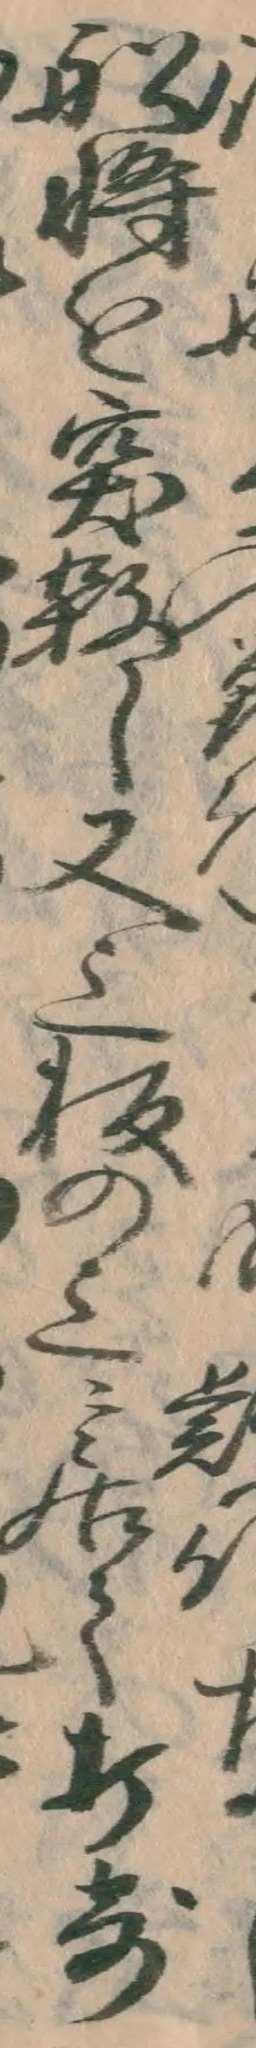船将を突殺し又上板の上ニ居て打寄
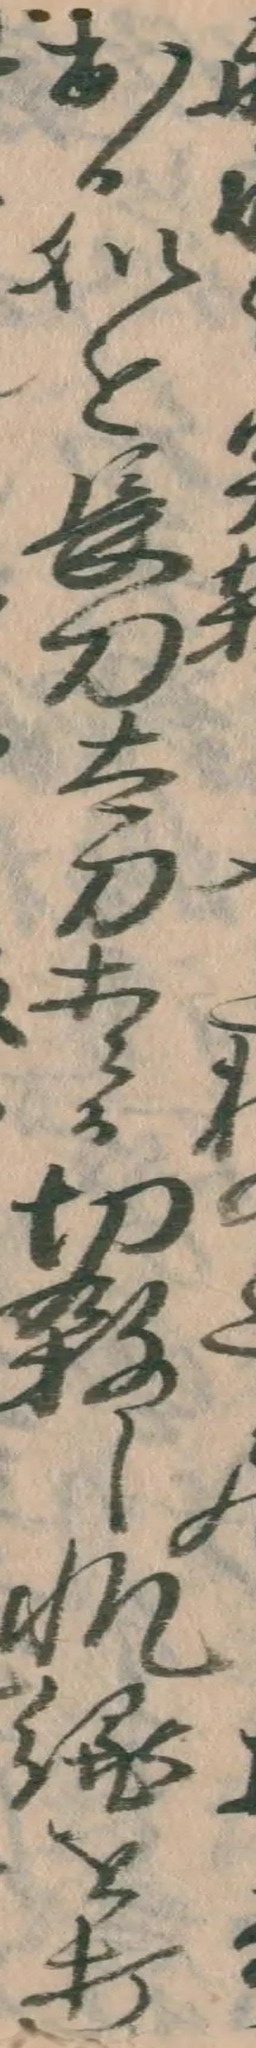出る処を長刀太刀等ニ而切殺し帆縄を打
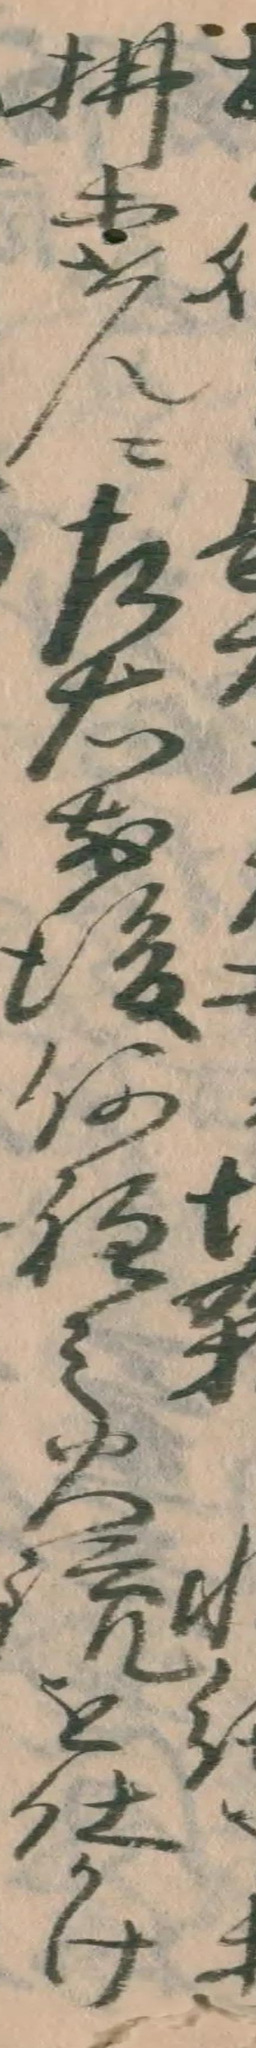拂等せんニ左右前後何程之火銃を仕かけ
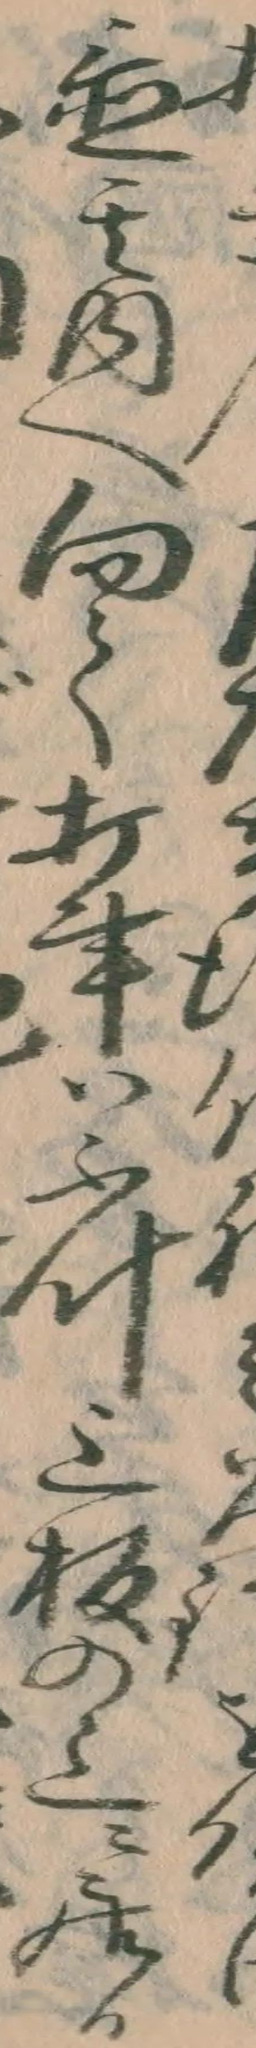置其内へ向て打事ハ不叶上板の上ニ居る
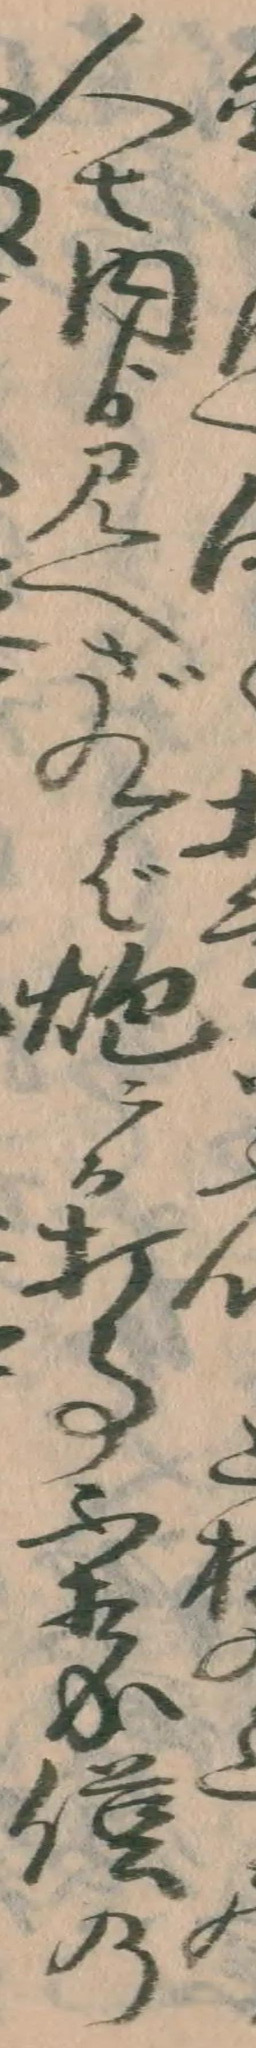人者内ゟ見へざれば炮ニ而打事不相成僅の
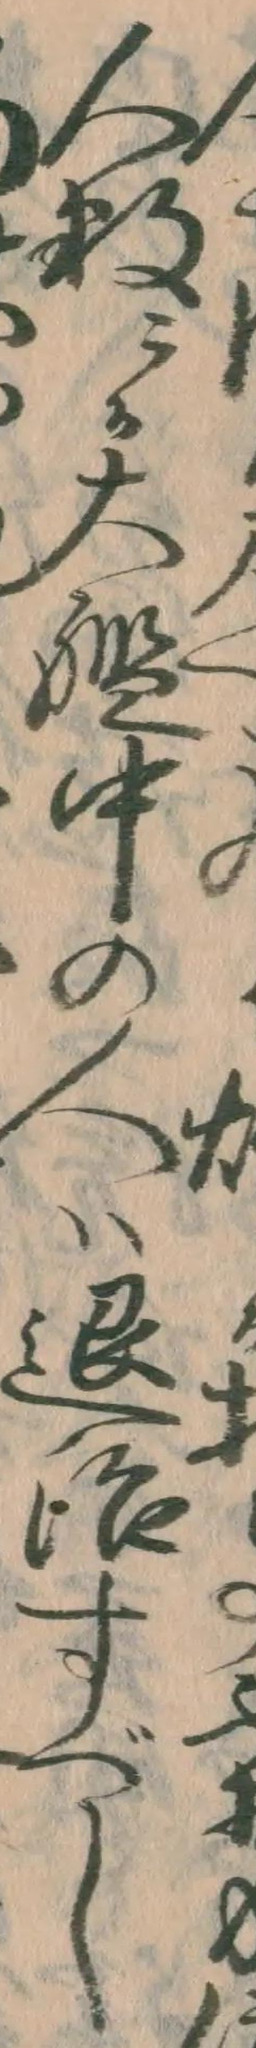人数ニ而大艦中の人ハ退治すべし
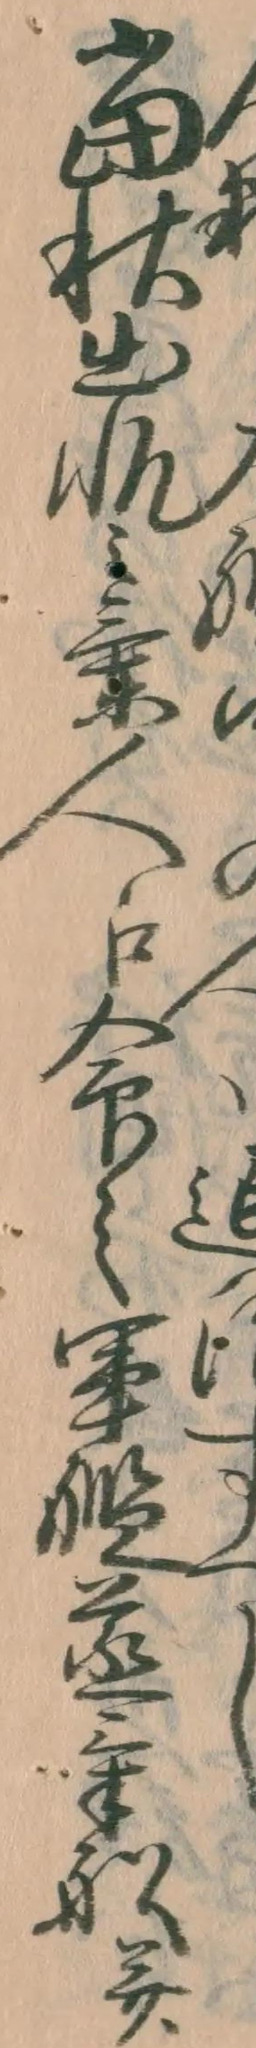一當秋出帆之蘭人江命之軍艦蒸気船幷
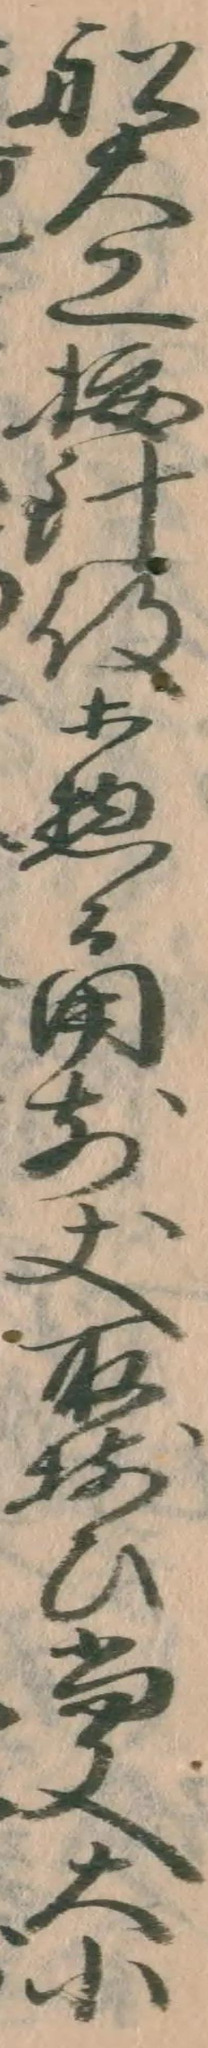船大工按針役等惣而用前丈取揃ひ尚又大小
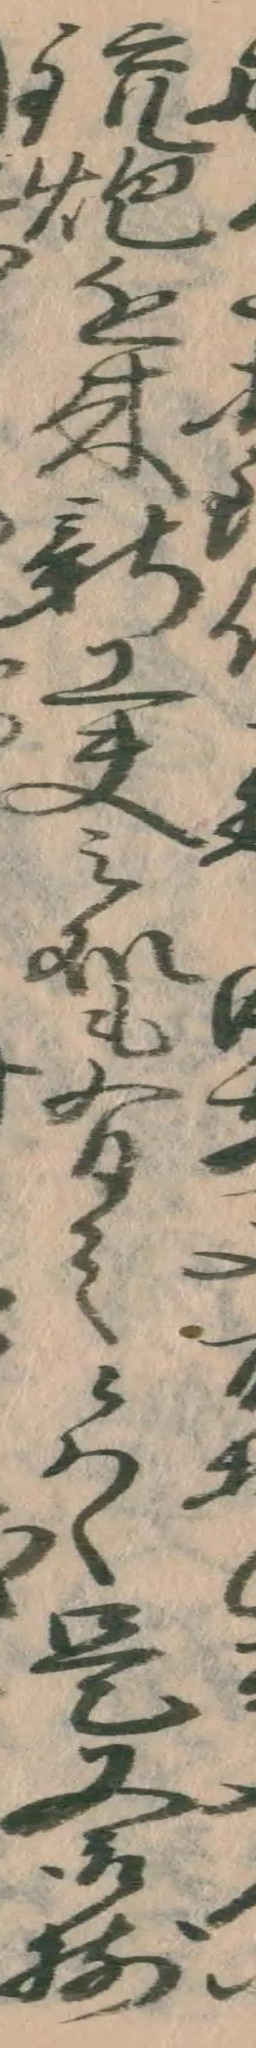銃炮近来新工夫之処も有之候ハヽ是又取揃
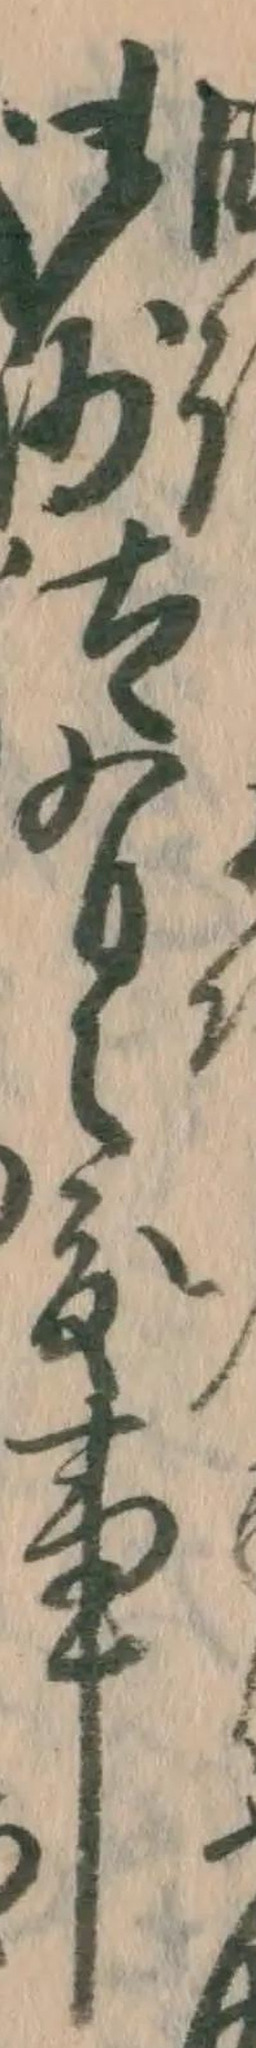御沙汰有之度事
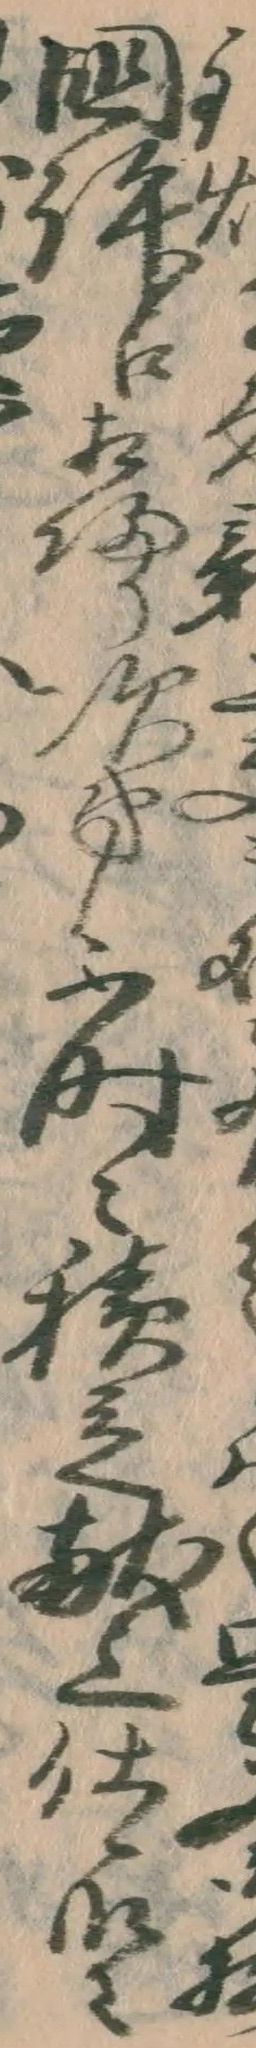国許江相帰り次第不時ニ積立献上仕候様に
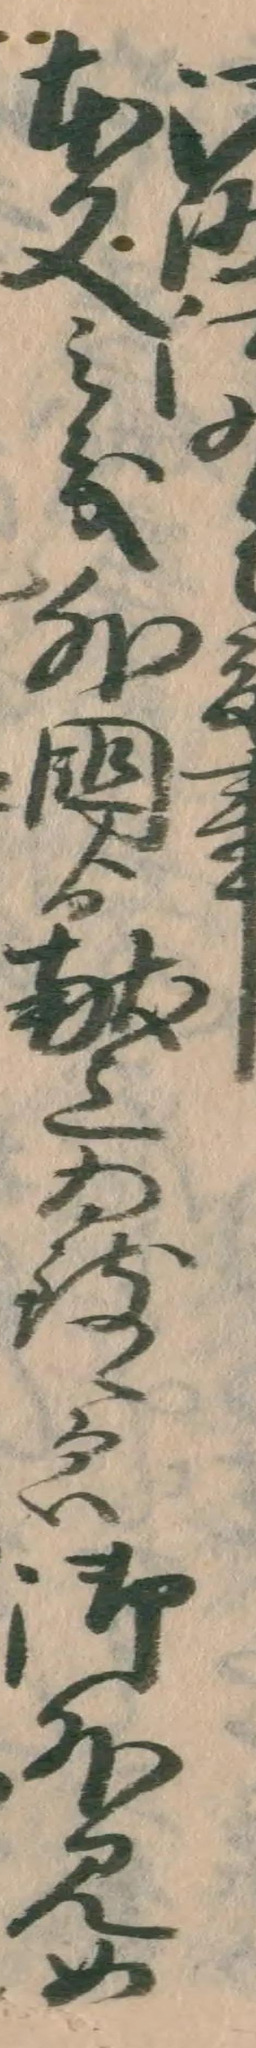一本文之義外国ゟ献上為致候而ハ御外見如
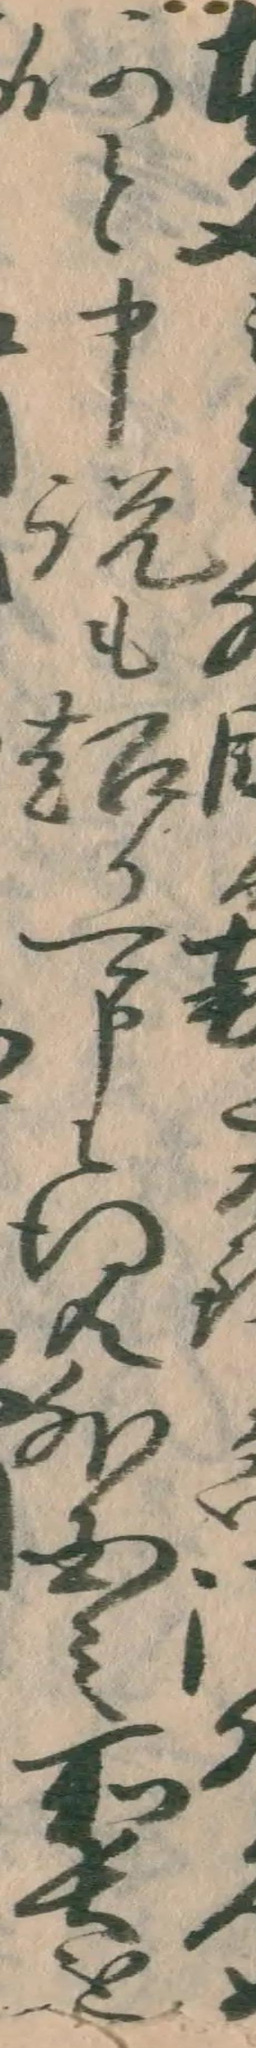何と申説も超り可申候得共外国之所長を
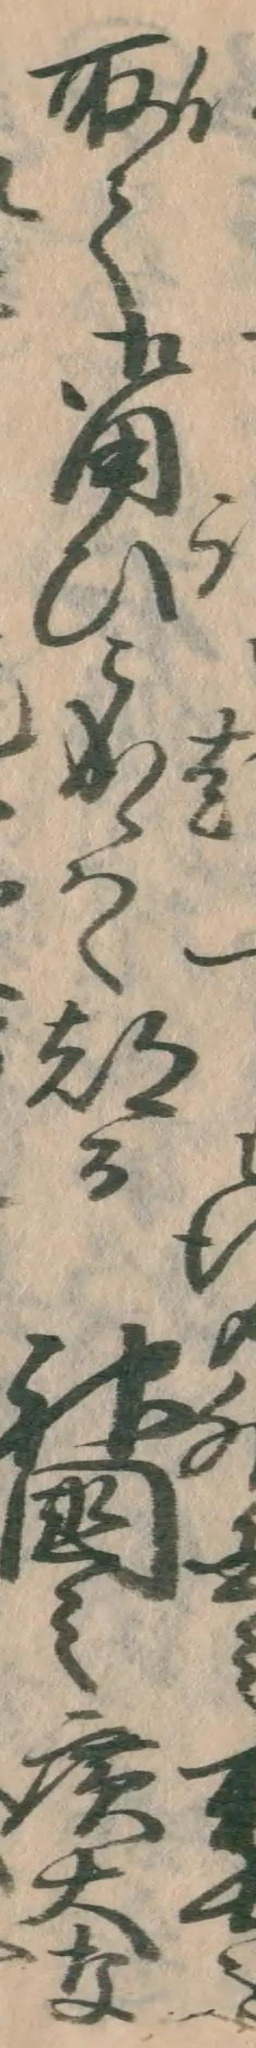取て御用ひ被成候ハヽ都而神国之廣大な
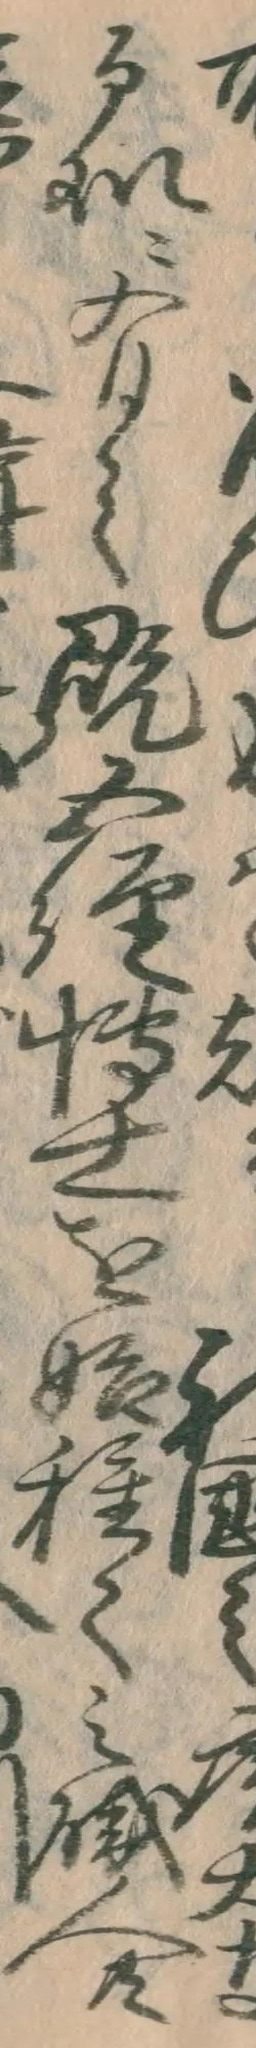る処ニ有之既五経博士を始種々之職人共
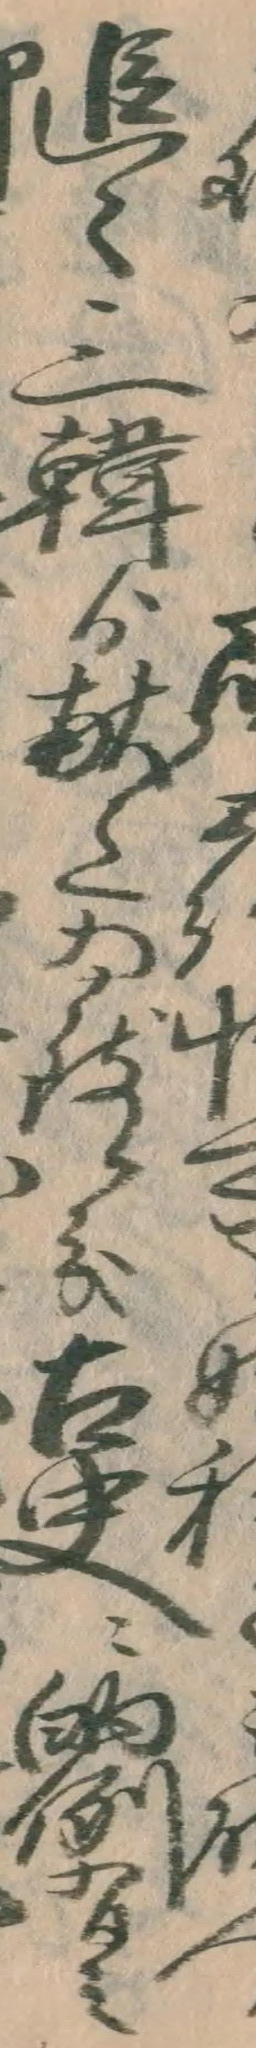追々三韓ゟ献上為致候義古史ニ的例有之
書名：麗斎叢書. 20
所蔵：国立国会図書館 National Diet Library, JAPAN
